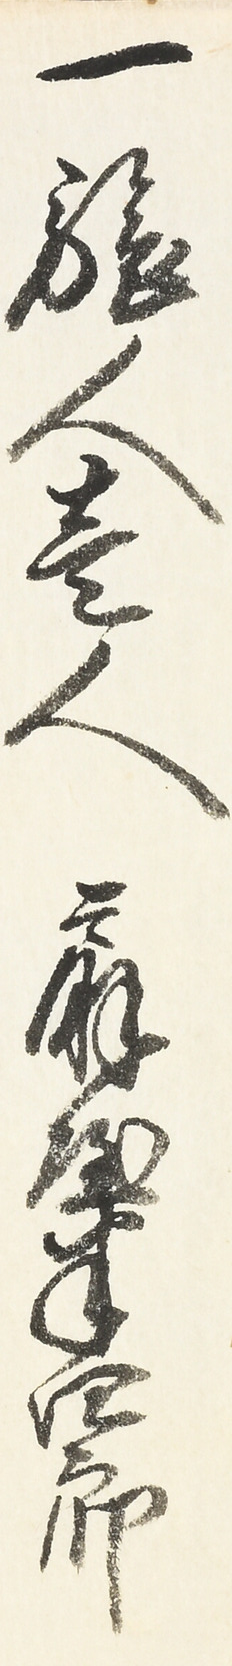一旅人壱人扇屋半四郎
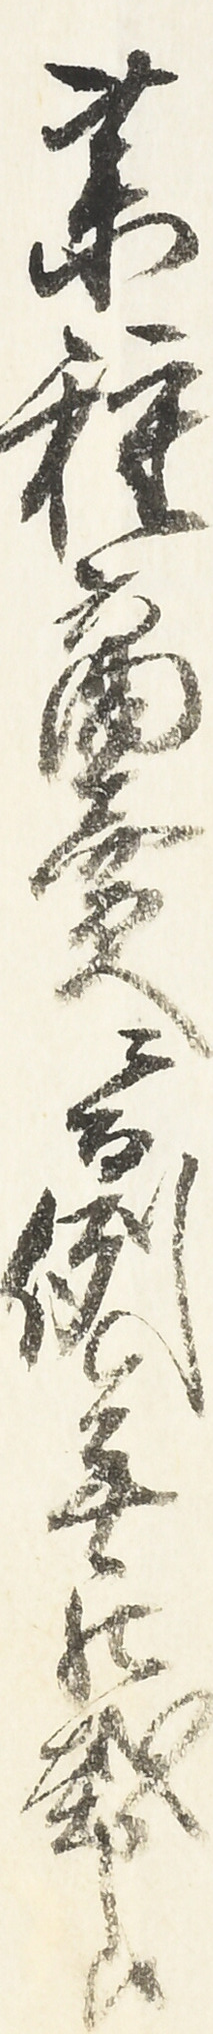薬種商売ニ而例年罷越申候
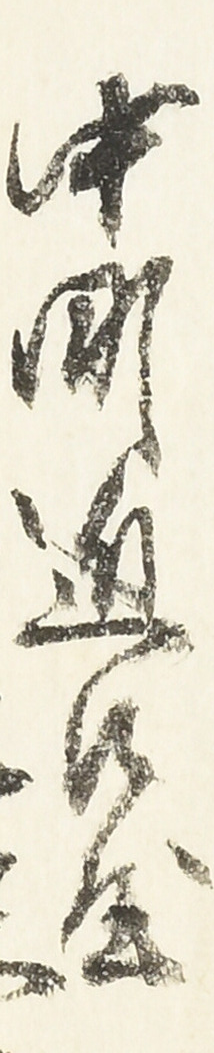中町近江屋
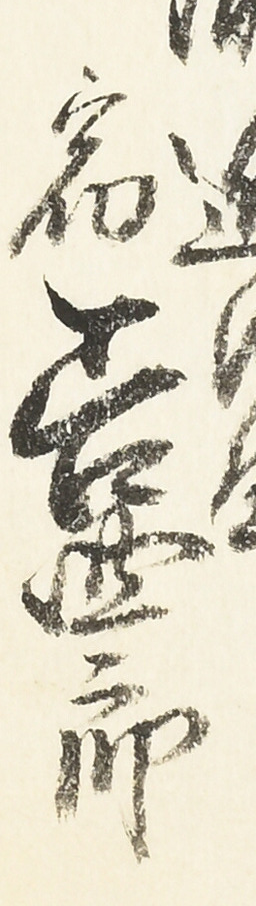宿善四郎
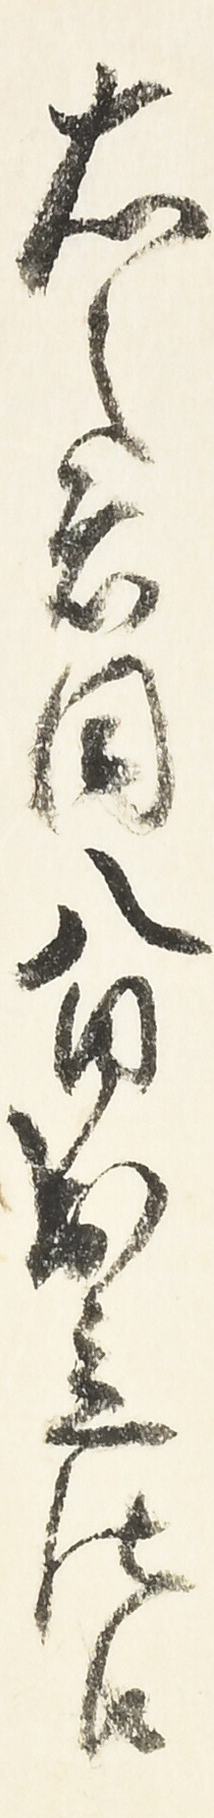右之者同八日出立仕候
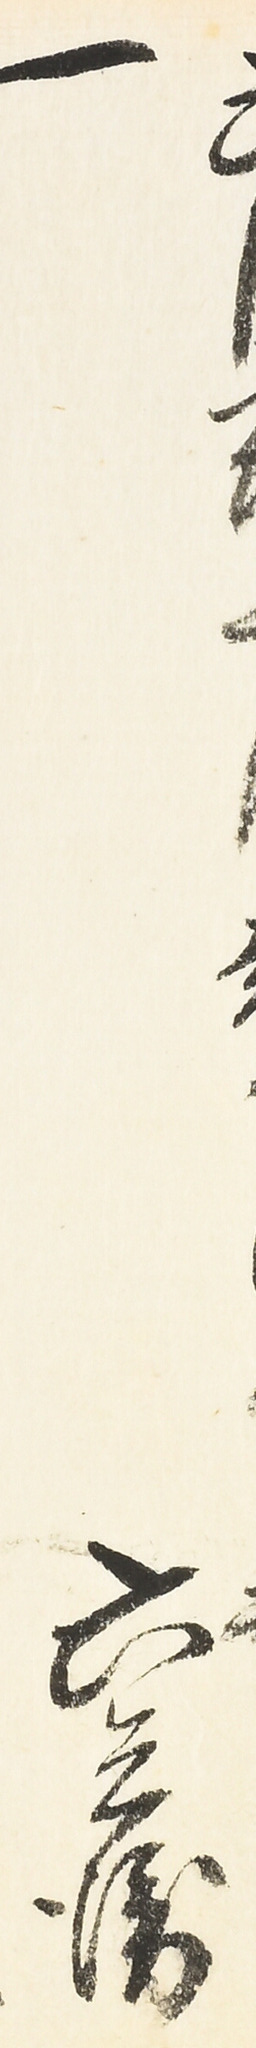一六兵衛
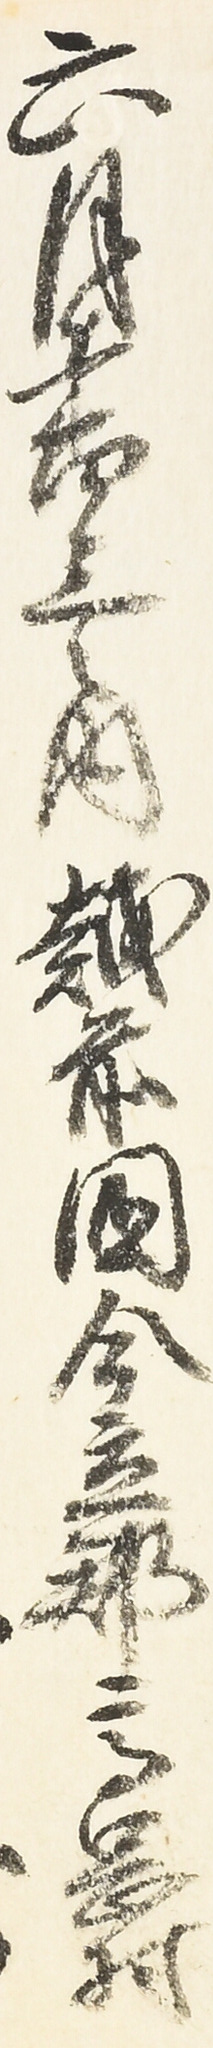六月書上之内越前国今立郡高岡村
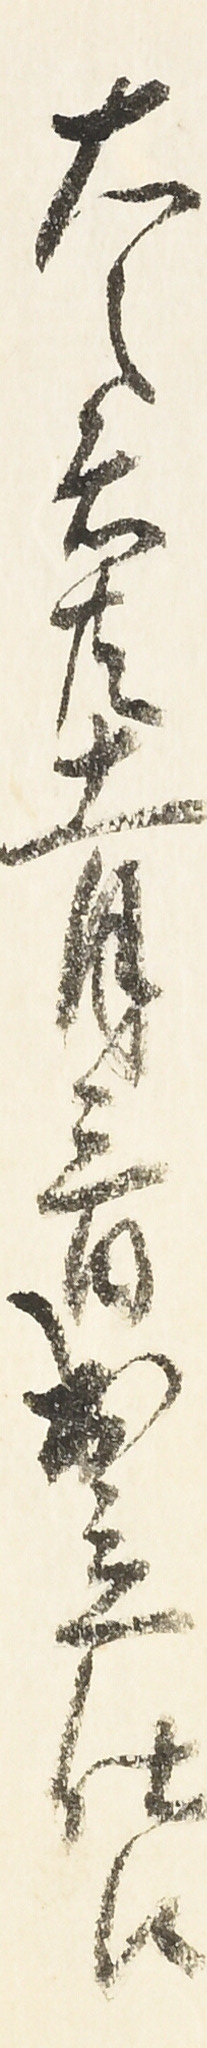右之者共十一月三日出立仕候
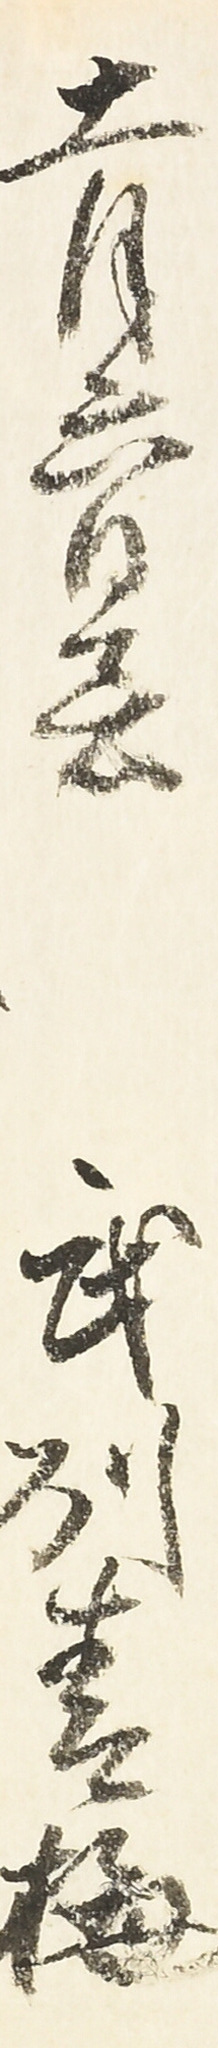十一月六日着武州青梅
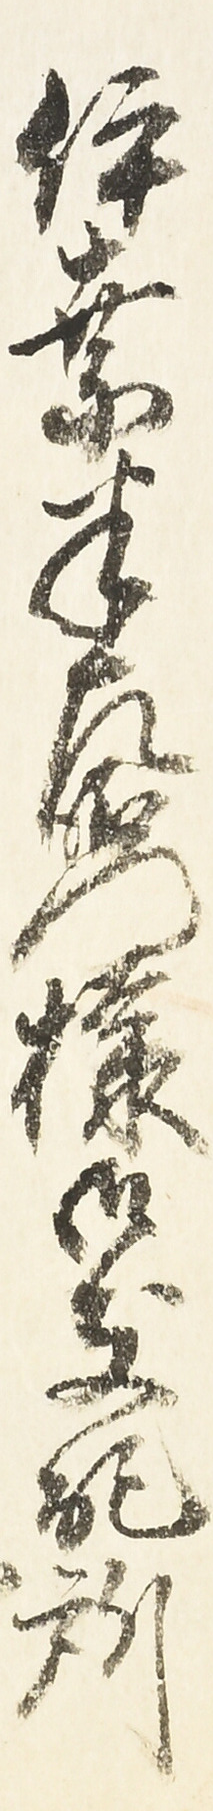伊奈半左衛門様御支配所
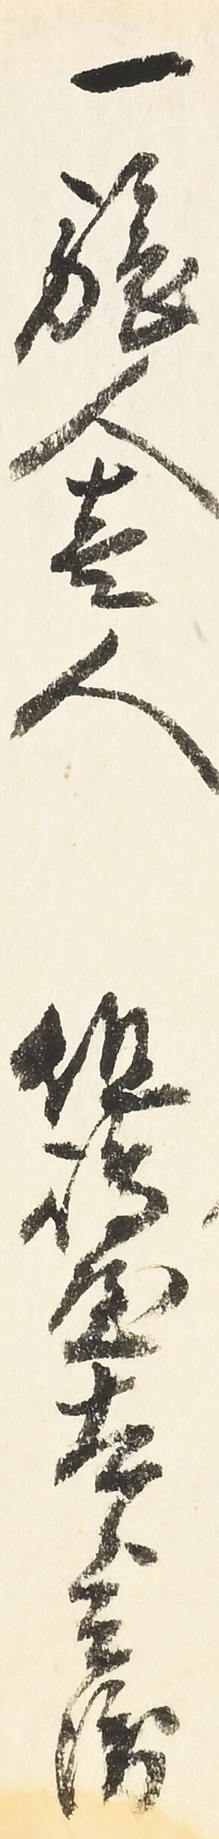一旅人壱人但嶋屋太郎兵衛
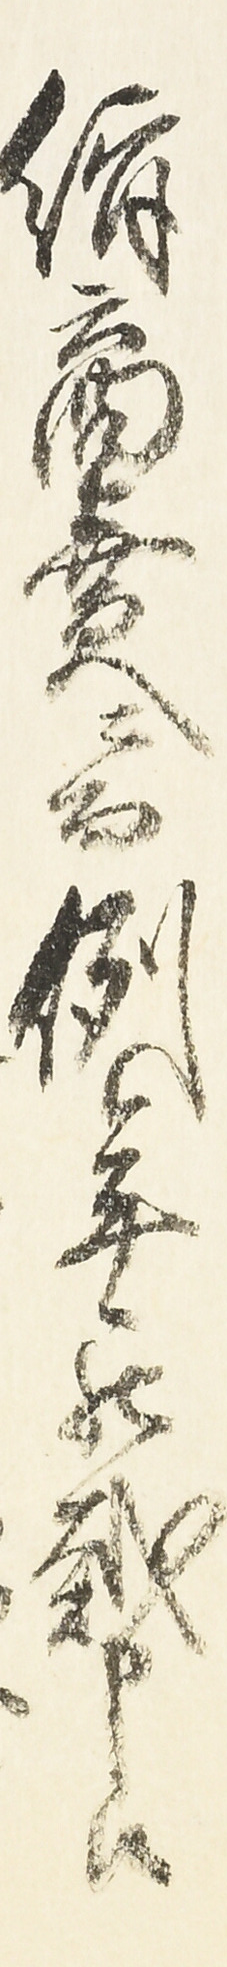絹商売ニ而例年罷越申候
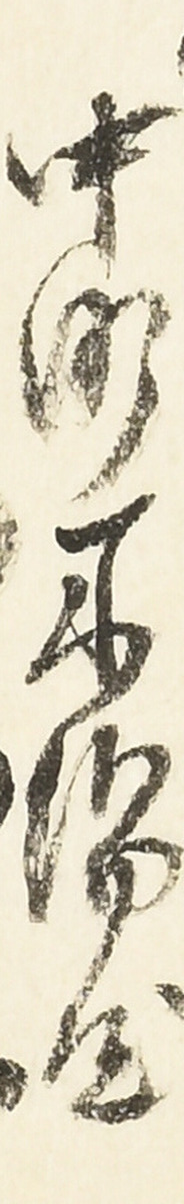中町木綿屋
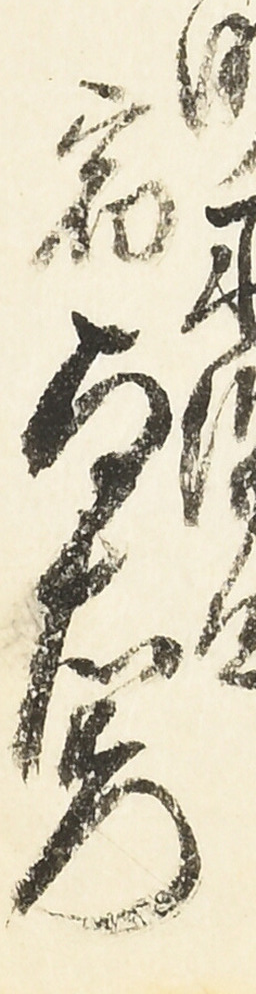宿与右衛門
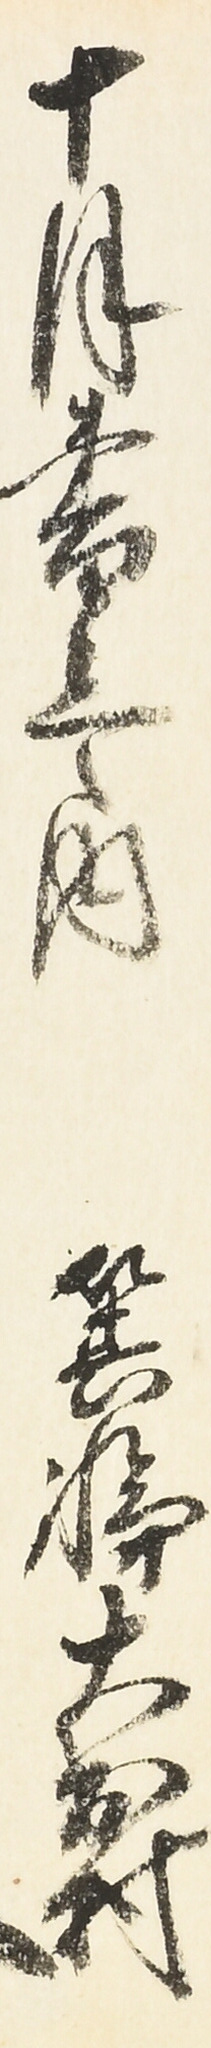十月書上之内箕輪大出村
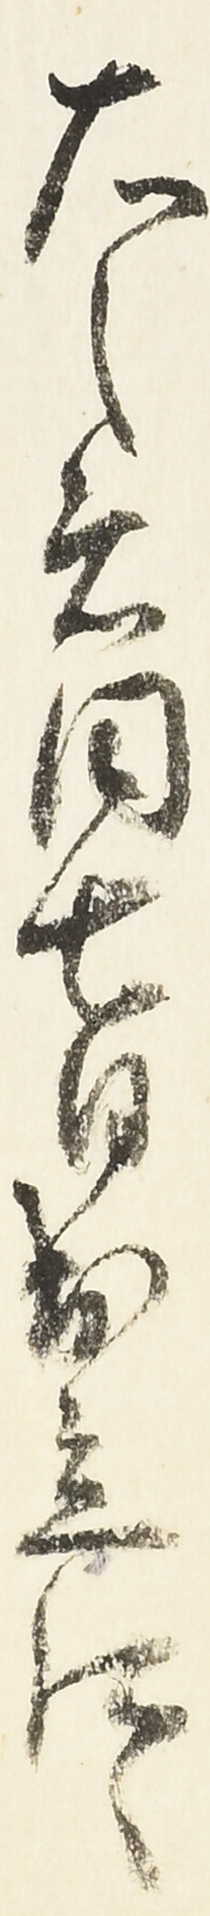右之者同七日出立仕候
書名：町中旅人泊控帳
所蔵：伊那市立高遠町図書館・合同会社AMANE
